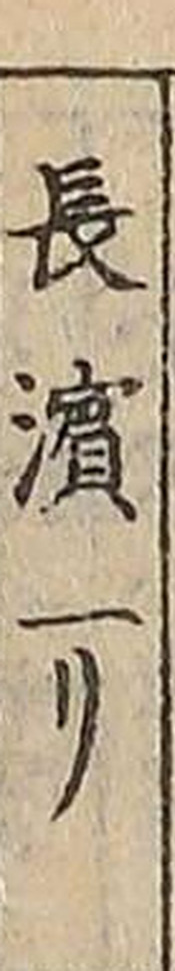長浜一リ
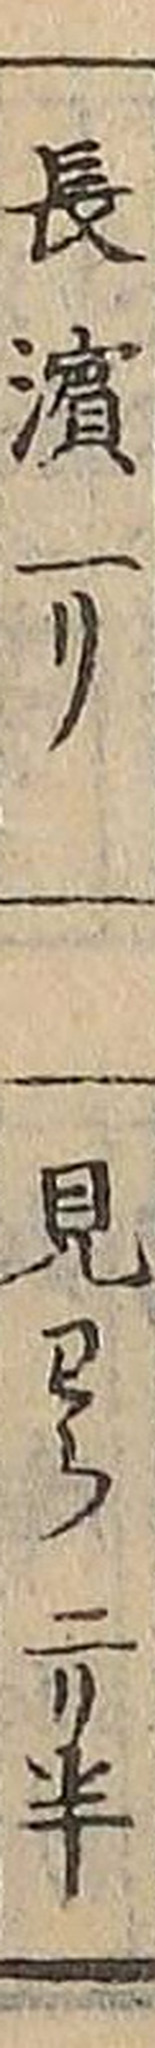見わら二リ半
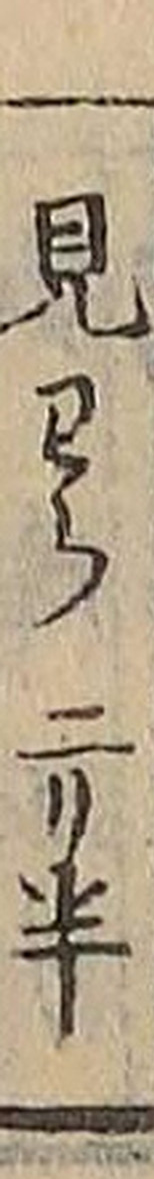見わら二リ半
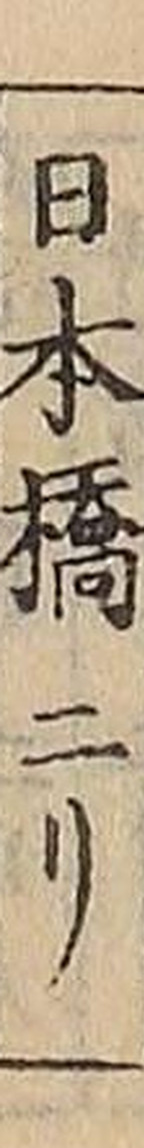日本橋二リ
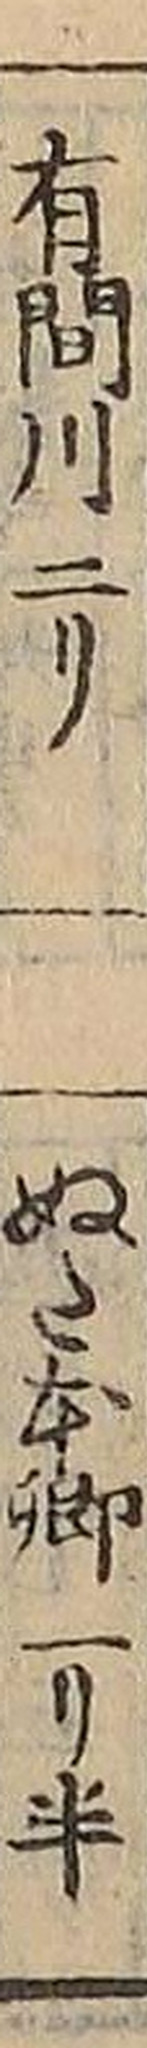有間川二リ
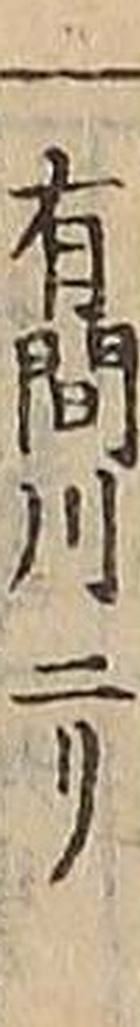有間川二リ
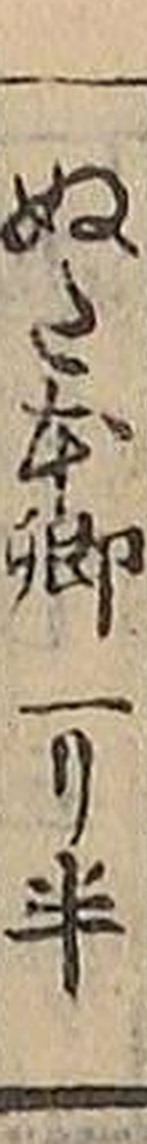ぬた本卿一リ半
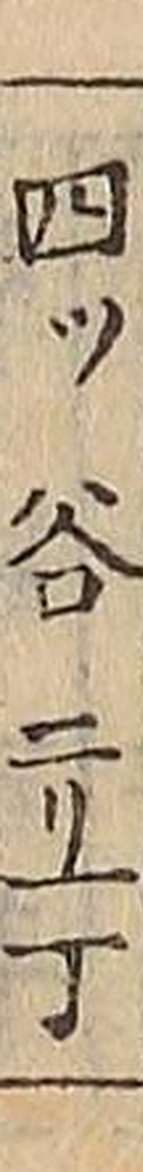四ツ谷二リ一丁
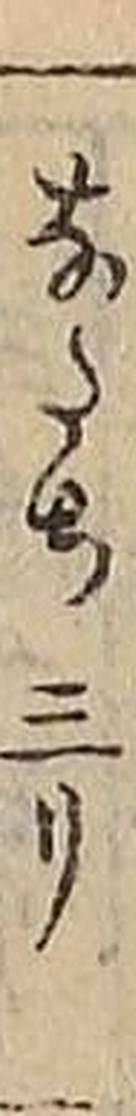なたち三リ
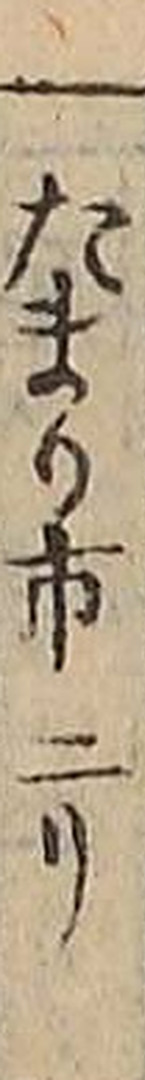たまり市二リ
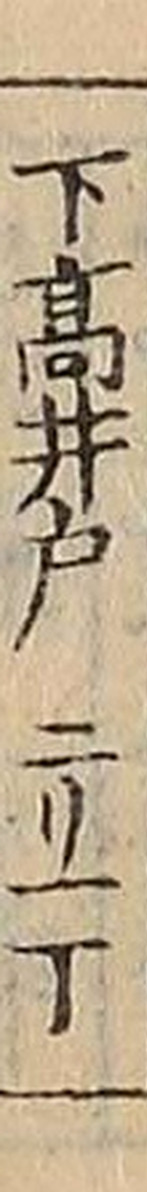下高井戸二リ一丁
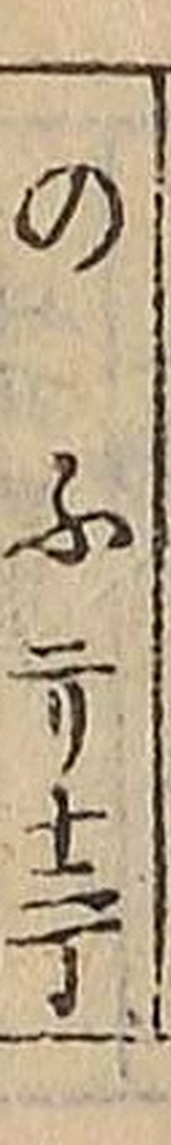のふ二リ十二丁
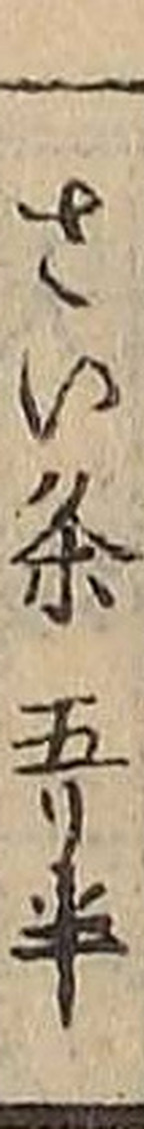さい条五リ半
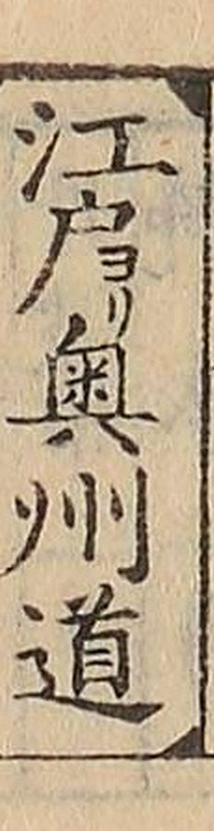江戸奥州道
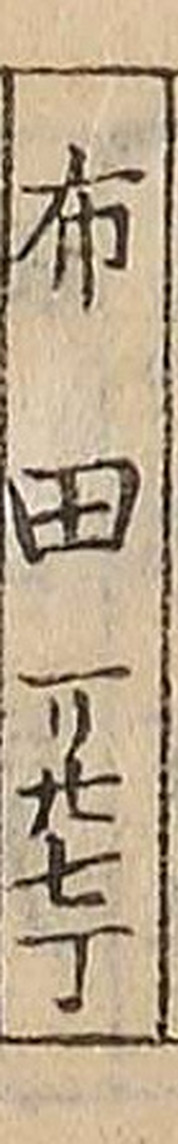布田一リ廿七丁
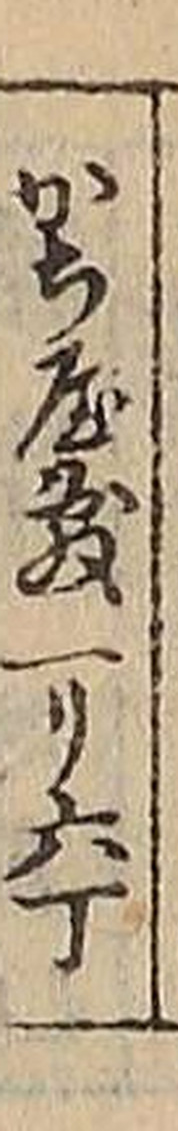かち屋敷一リ六丁
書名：旅行用心集
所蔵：神戸大学附属図書館 国文学研究資料館
